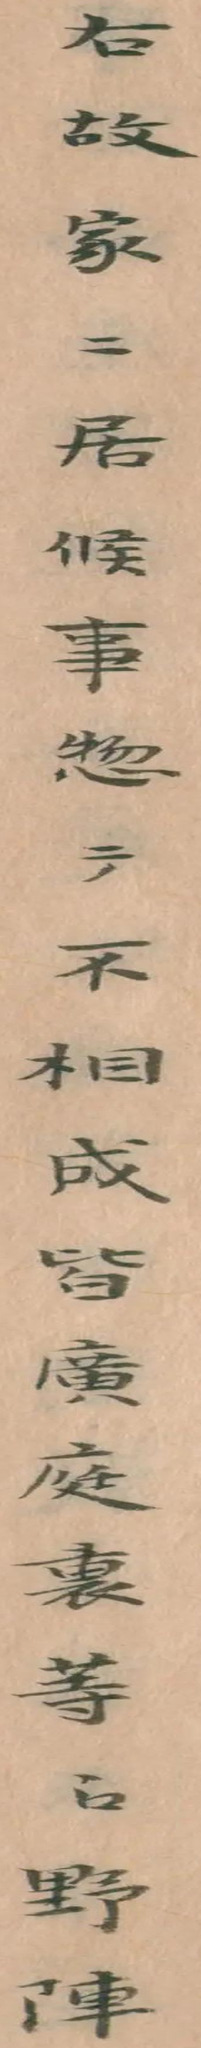右故家二居候事惣テ不相成皆広庭裏等江野陣
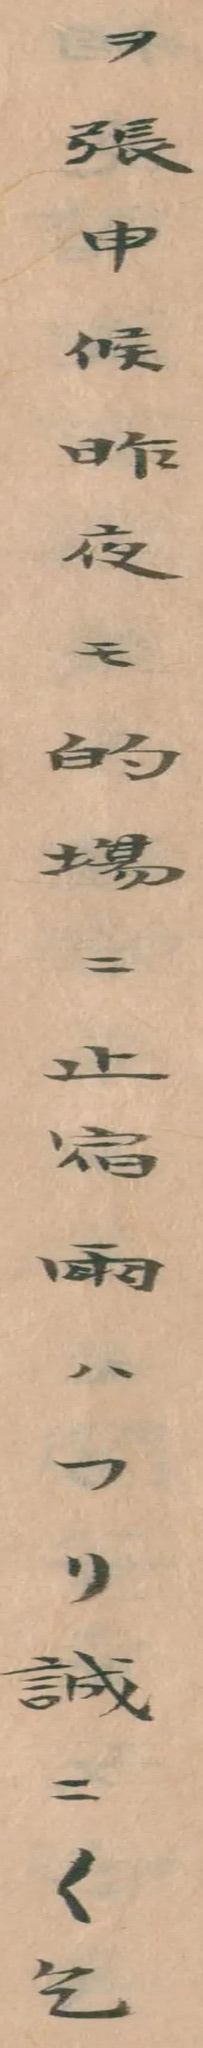ヲ張申候昨夜モ的場二止宿雨ハフリ誠二〳〵乞
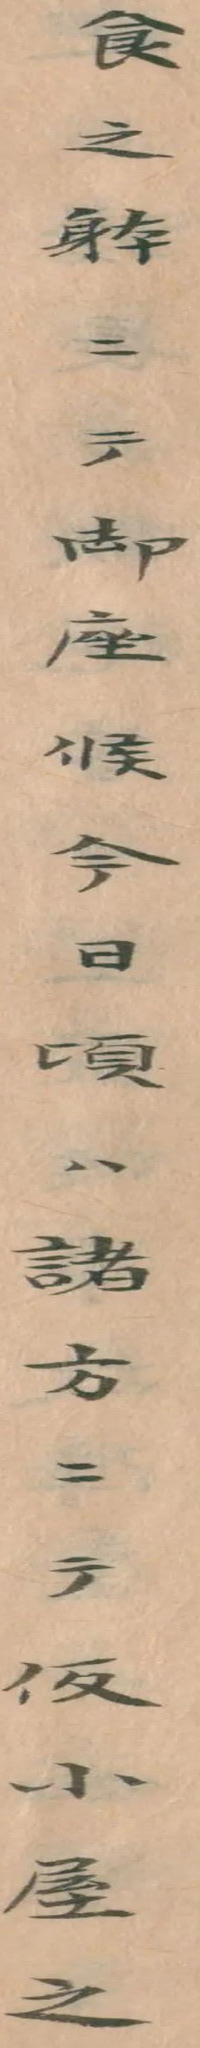食之体二テ御座候今日頃ハ諸方二テ仮小屋之
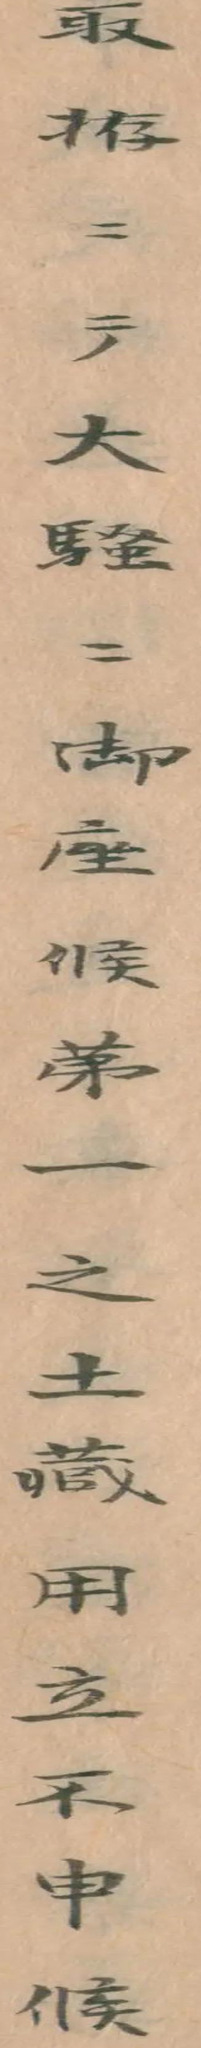取拵二テ大騒二御座候第一之土蔵用立不申候

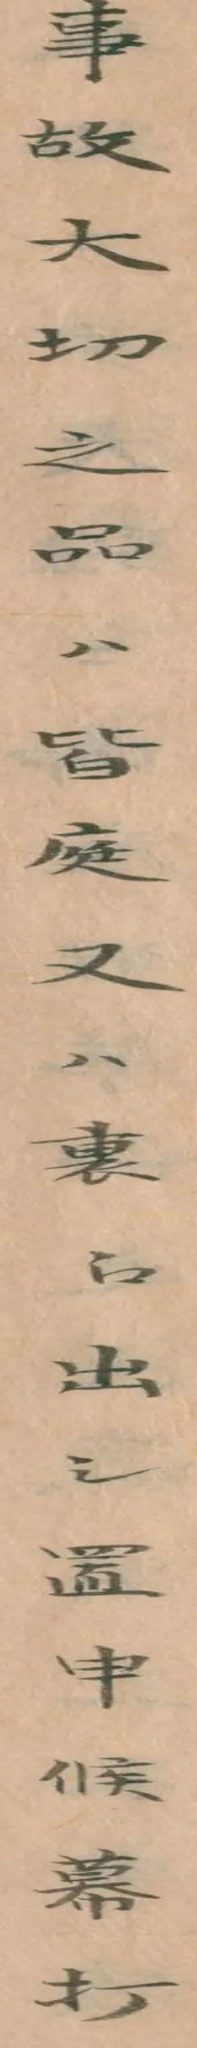事故大切之品ハ皆庭又ハ裏江出シ置申候幕打
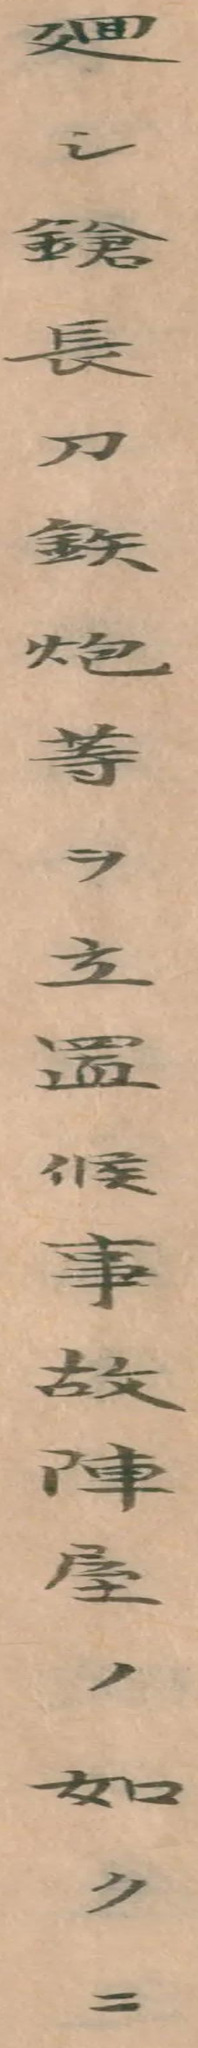廻シ鎗長刀鉄炮等ヲ立置候事故陣屋ノ如クニ
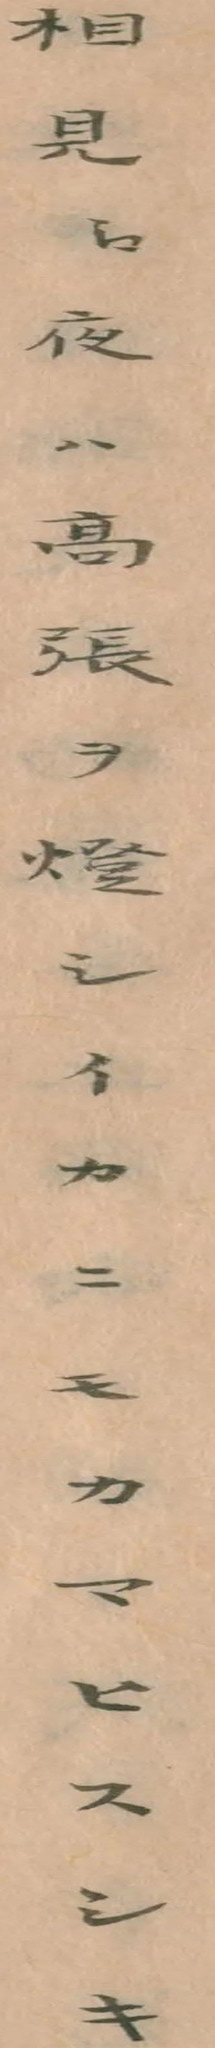相見江夜ハ高張ヲ燈シイカニモカマヒスシキ
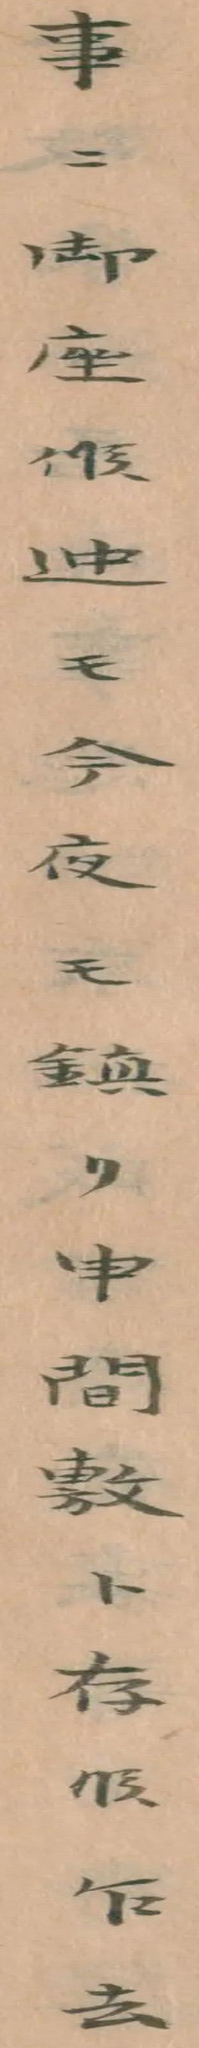殊二御座候迚モ今夜モ鎮り申間敷ト存候乍去
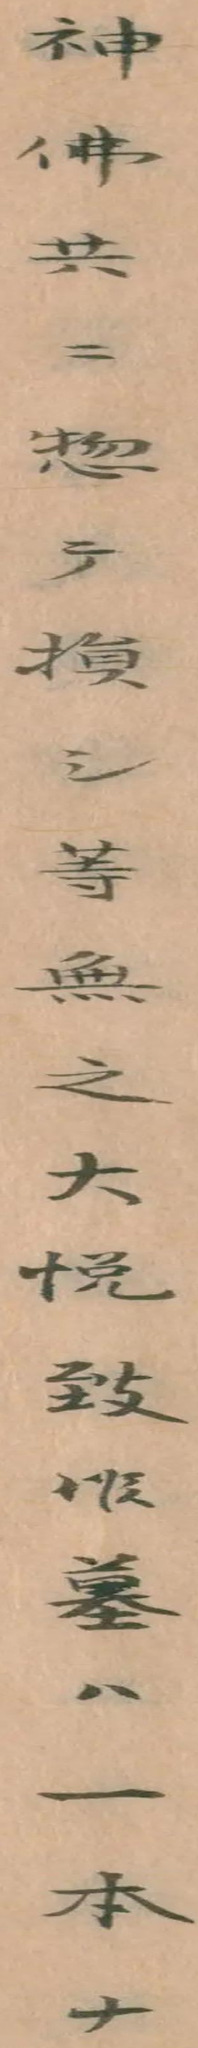神仏共二惣テ損シ等無之大悦致候墓ハ一本ナ
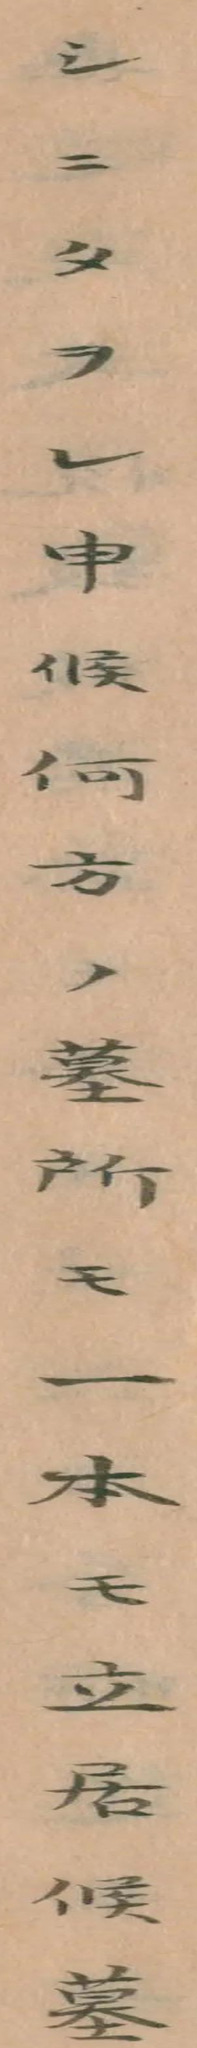シニタフレ申候何方之墓所モ一本モ立居候墓
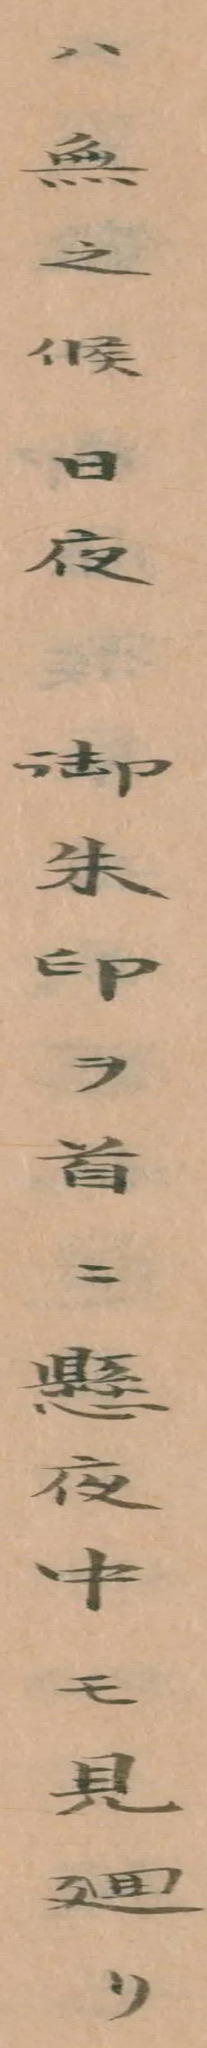ハ無之候日夜御朱印ヲ首二懸夜中モ見回り
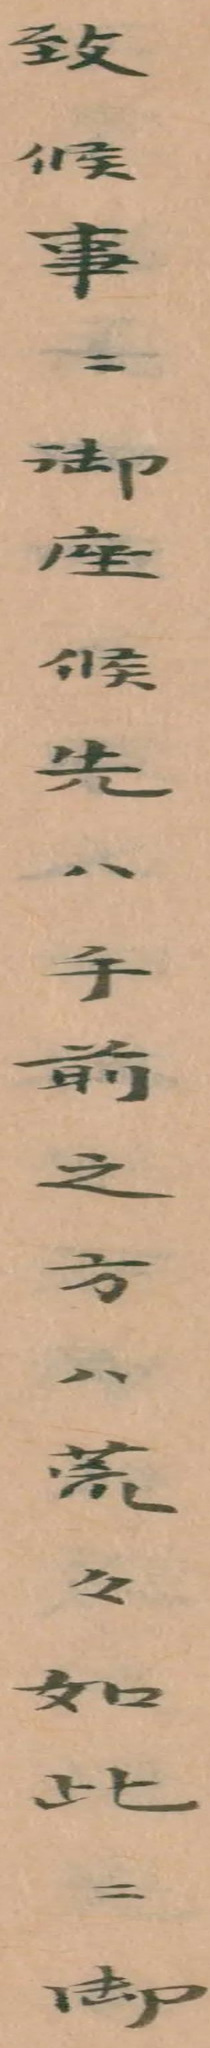致候事二御座候先ハ手前之方ハ荒々如此二御
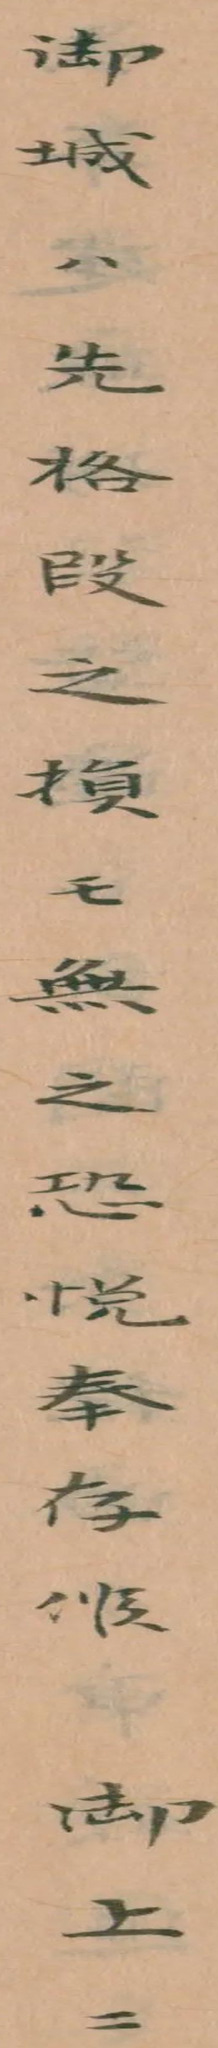御城ハ先格段之損モ無之恐悦奉存候御上二
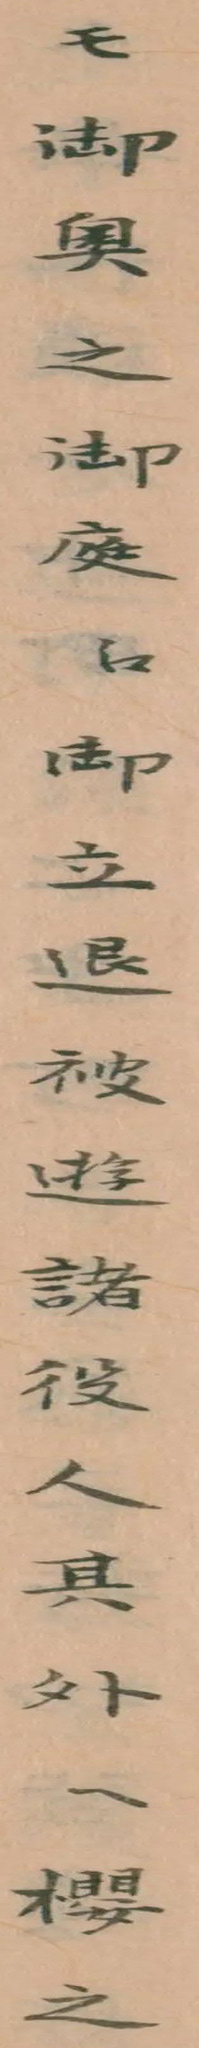モ御奥之御庭得御立退被遊所役人其外へ桜之
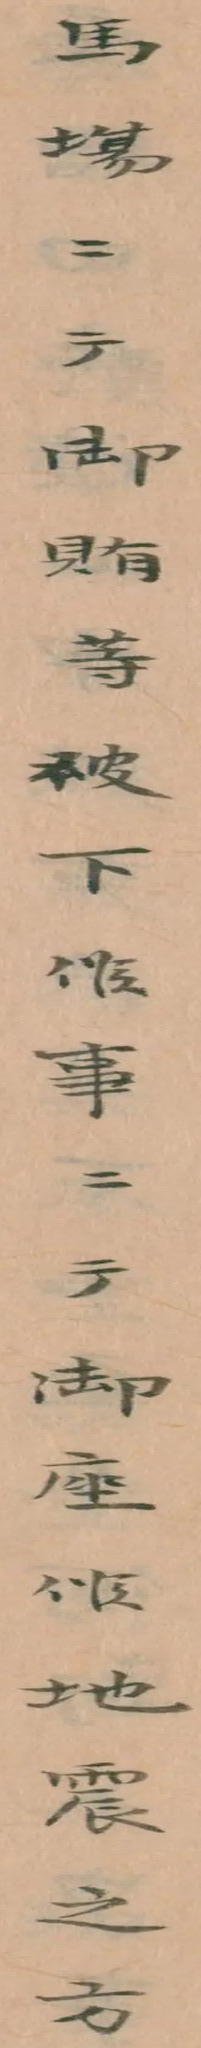馬場ニテ御賄等被下候事ニテ御座候地震之方
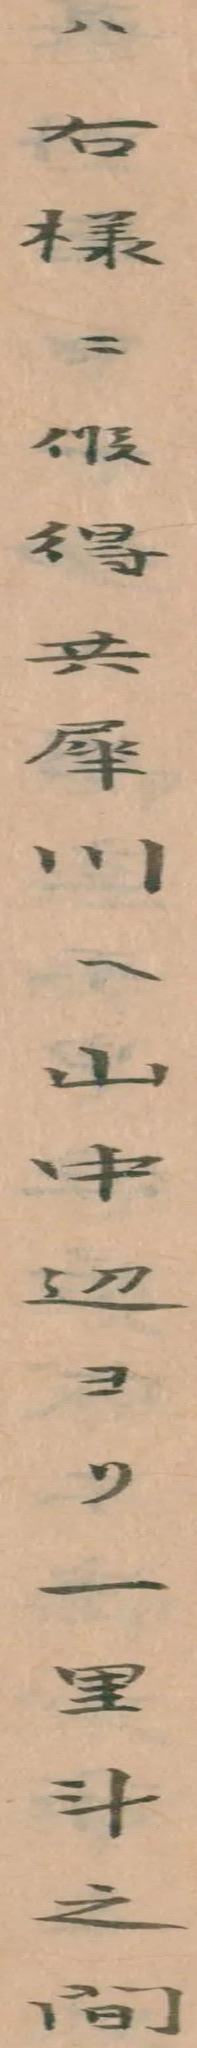ハ右様二候得共犀川へ山中辺ヨリ一里斗之間
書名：地災撮要. 巻1(噴火山・地震ノ部)
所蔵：国立国会図書館 National Diet Library, JAPAN
